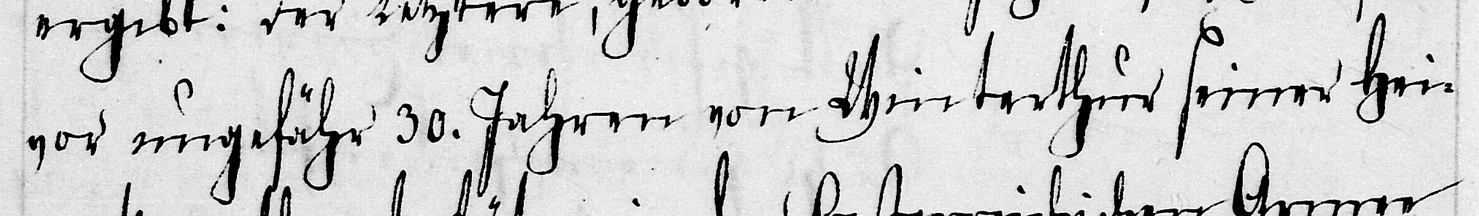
vor ungefähr 30. Jahren von Winterthur seiner Hei¬
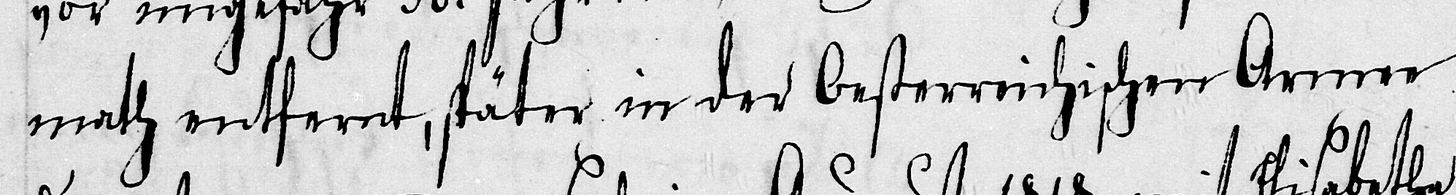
math entfernt, später in der Oesterreichischen Armee
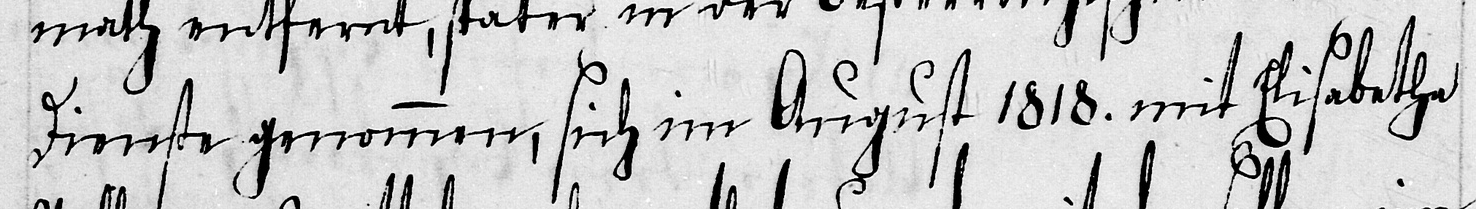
Dienste genommen, sich im August 1818. mit Elisabetha
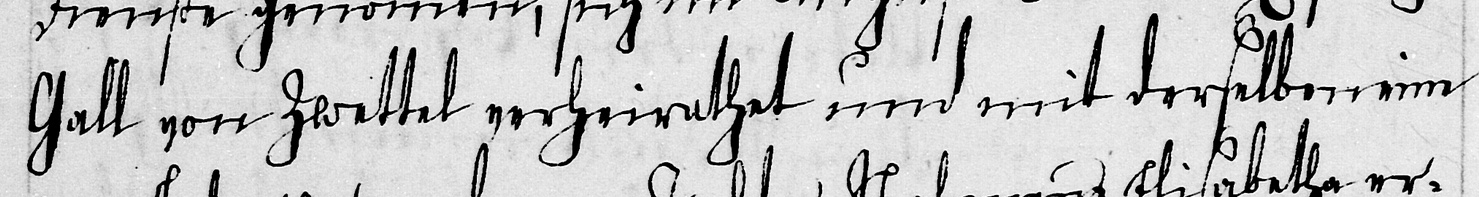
Gall von Zwettel verheirathet und mit derselben eine
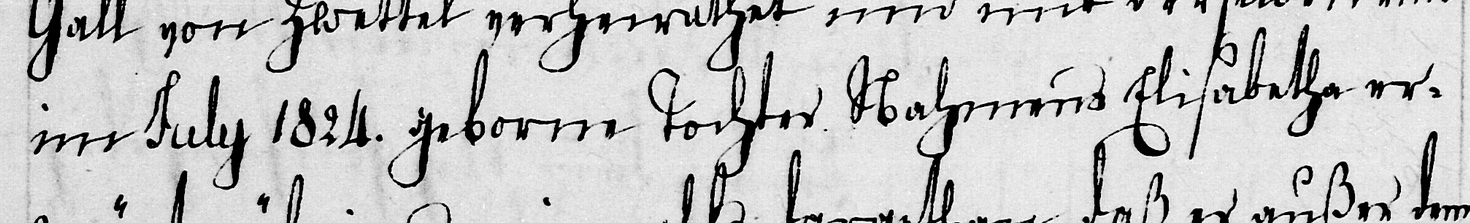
im July 1824. geborne Tochter Nahmens Elisabetha er¬
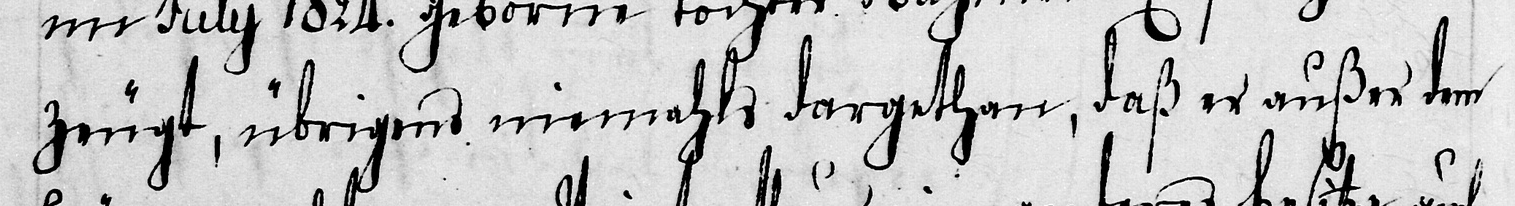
zeugt, übrigens niemahls dargethan, daß er außer dem
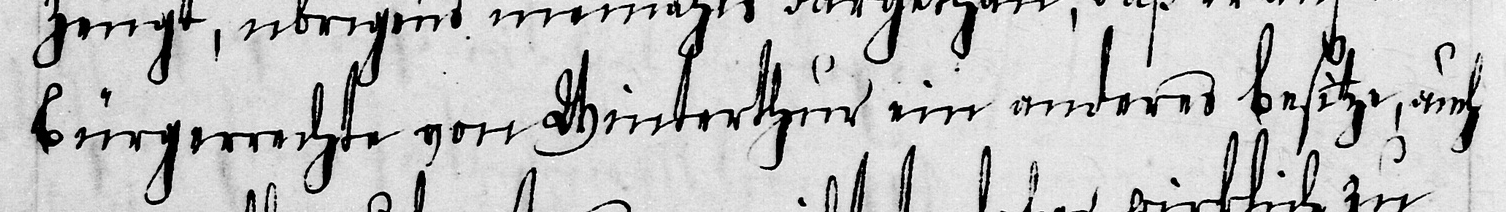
Bürgerrechte von Winterthur ein anderes besitze, auch
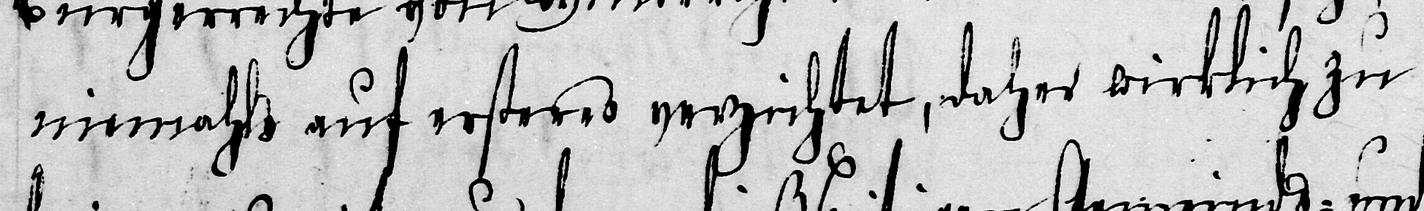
niemahls auf ersteres verzichtet, daher wirklich zu
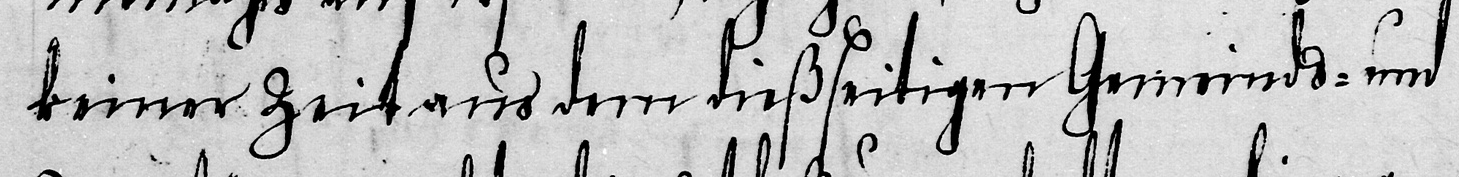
keiner Zeit aus dem dießseitigen Gemeinds- und
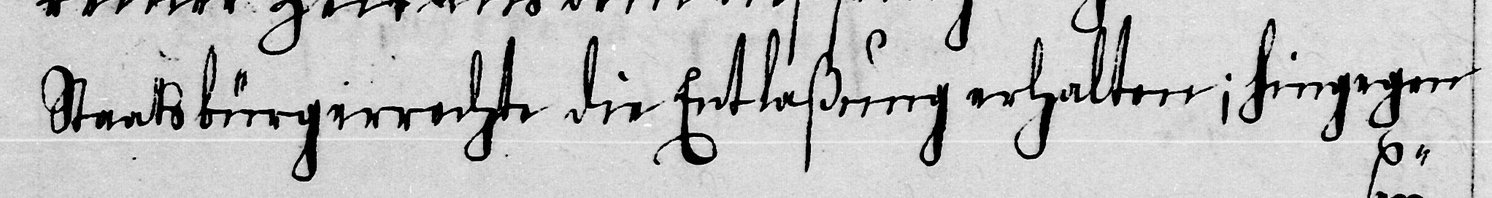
Staatsbürgerrechte die Entlaßung erhalten; hingegen
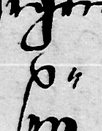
s¬
